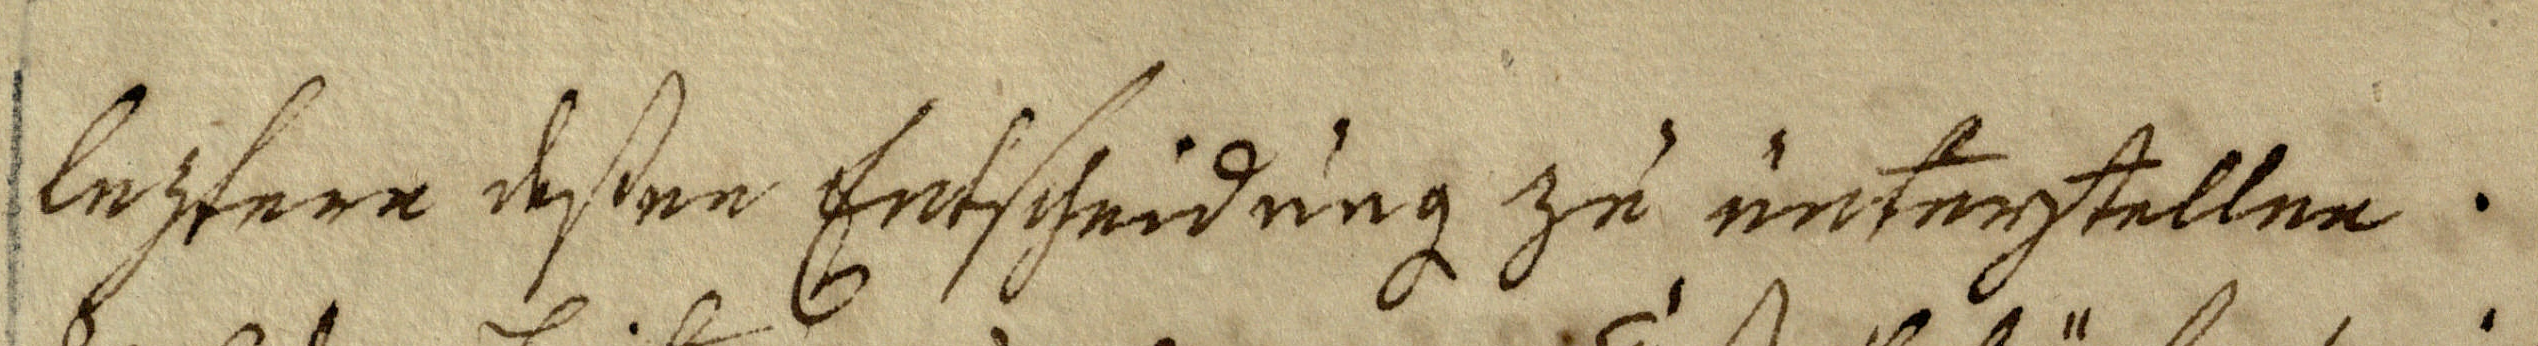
leztere deßen Entscheidung zu unterstellen.
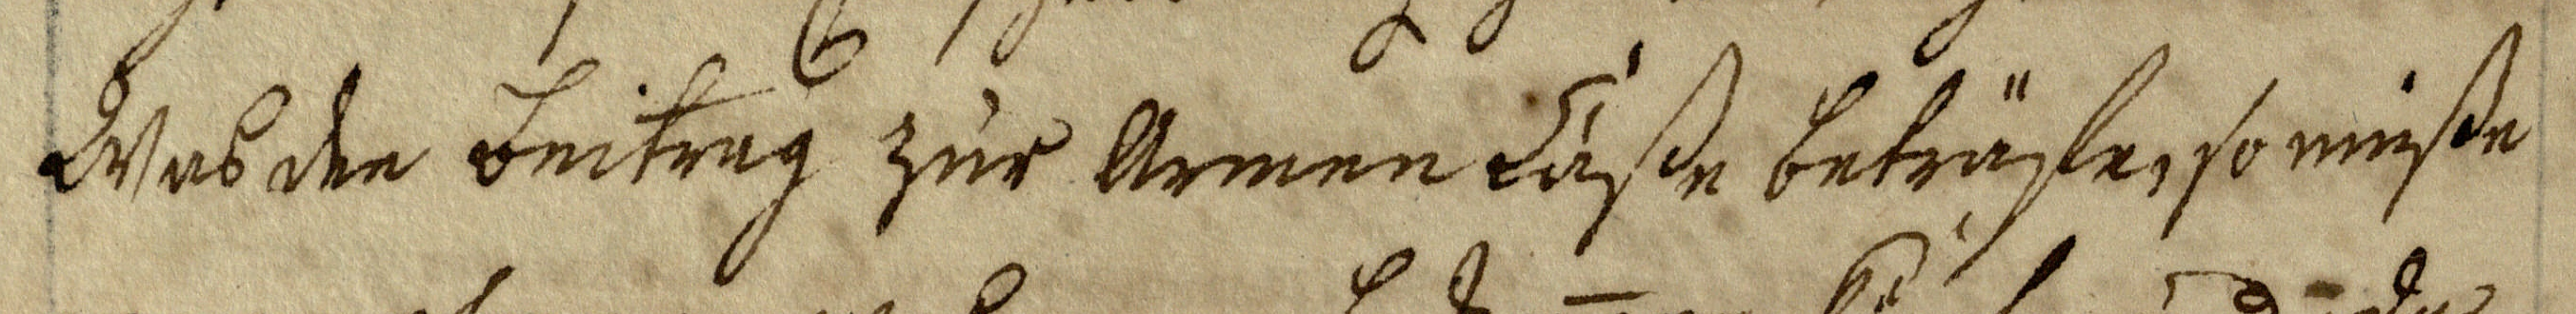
Was den Beitrag zur Armen Caße beträfe, so müße
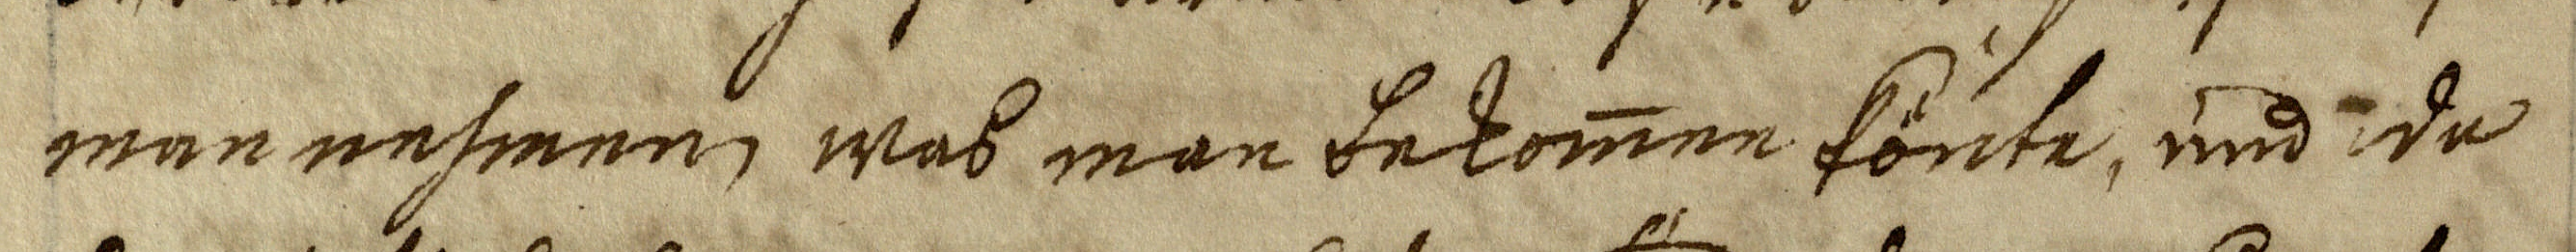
man nehmen, was man bekomen könnte, und da
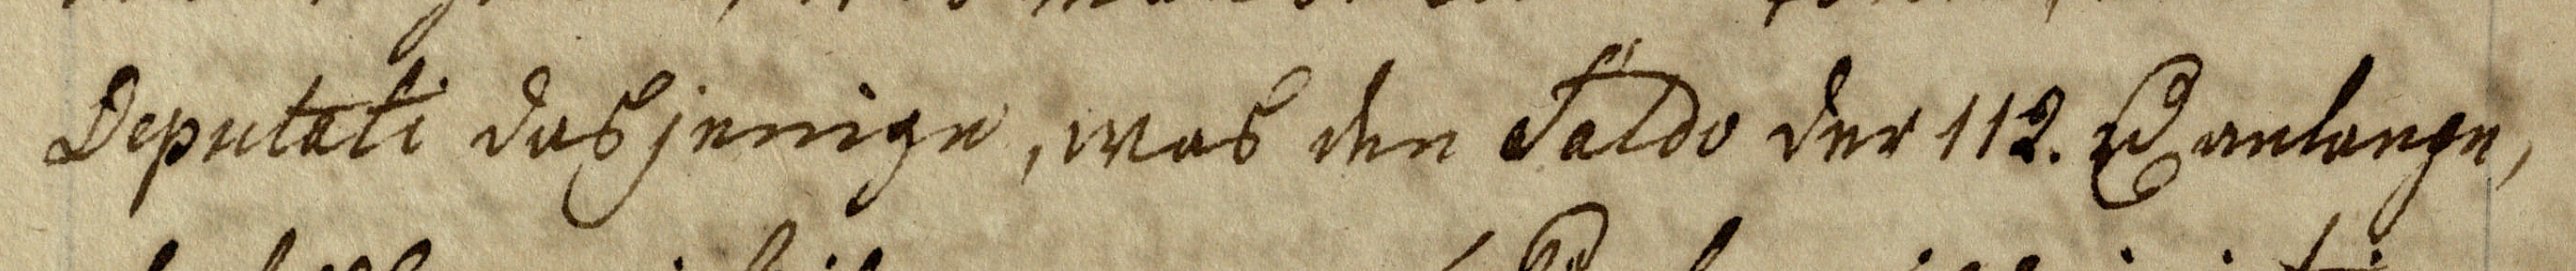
Deputati dasjenige, was den Saldo der 112. r anlangte,
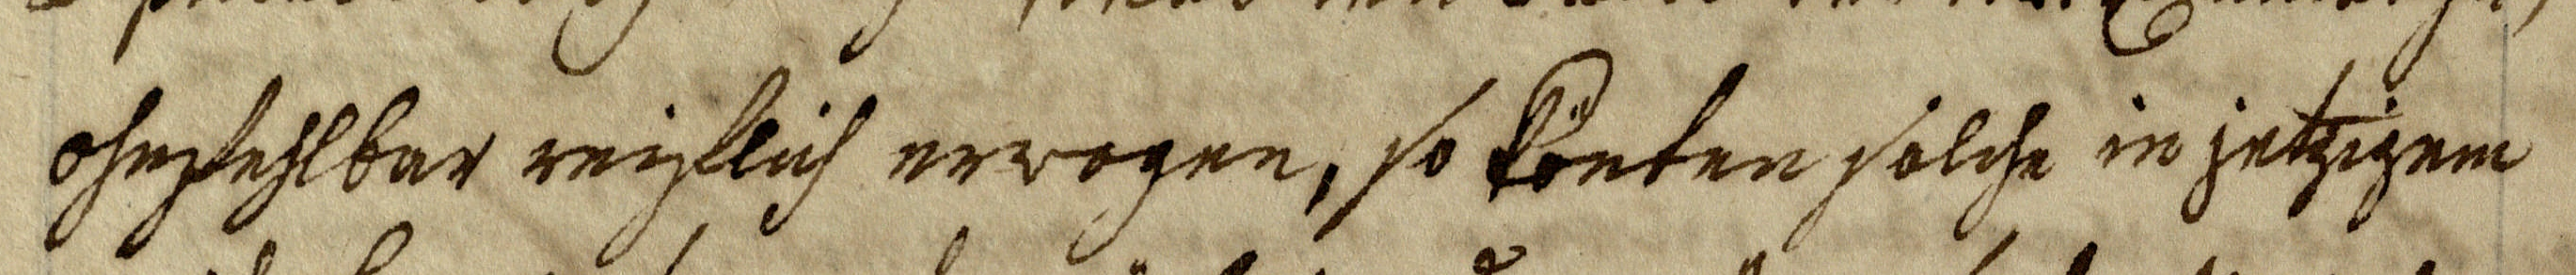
ohnfehlber reiflich erwogen, so könten solche in jetzigem
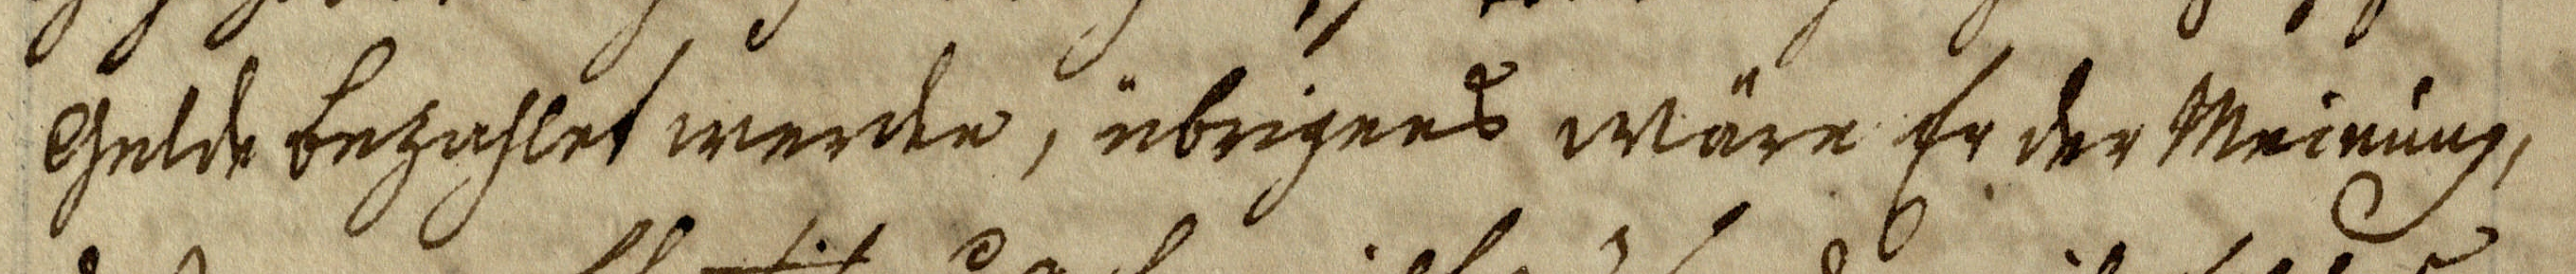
Gelde bezahlet werden, übrigens wäre Er der Meinung,
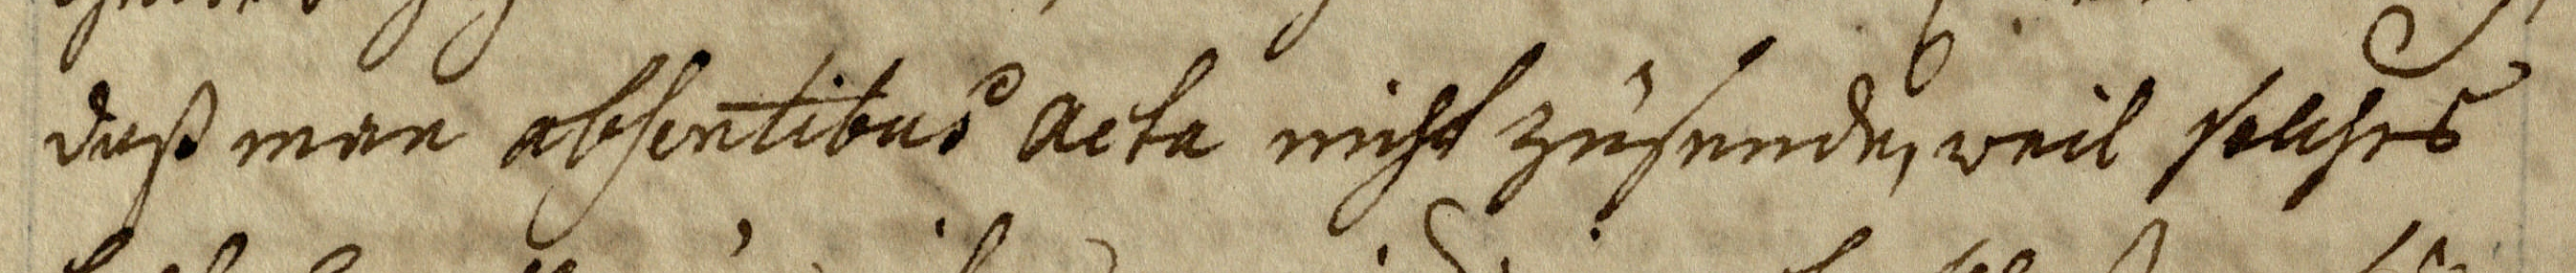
daß man absentibus Acta nicht zusende, weil solches
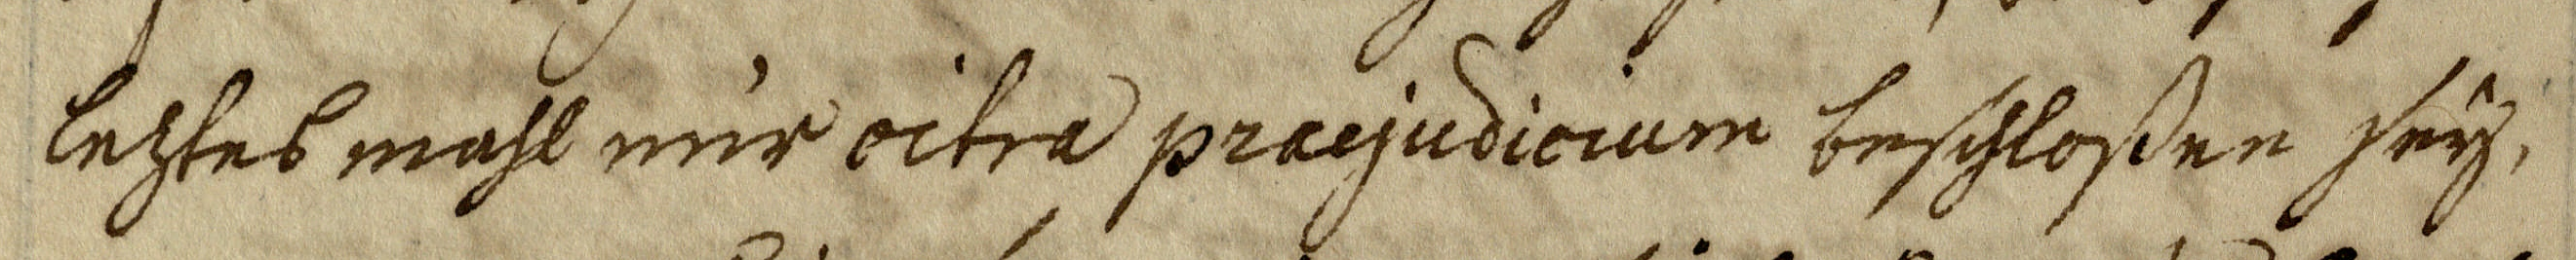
lezter mahl nur citra praejudicium beschloßen seÿ,
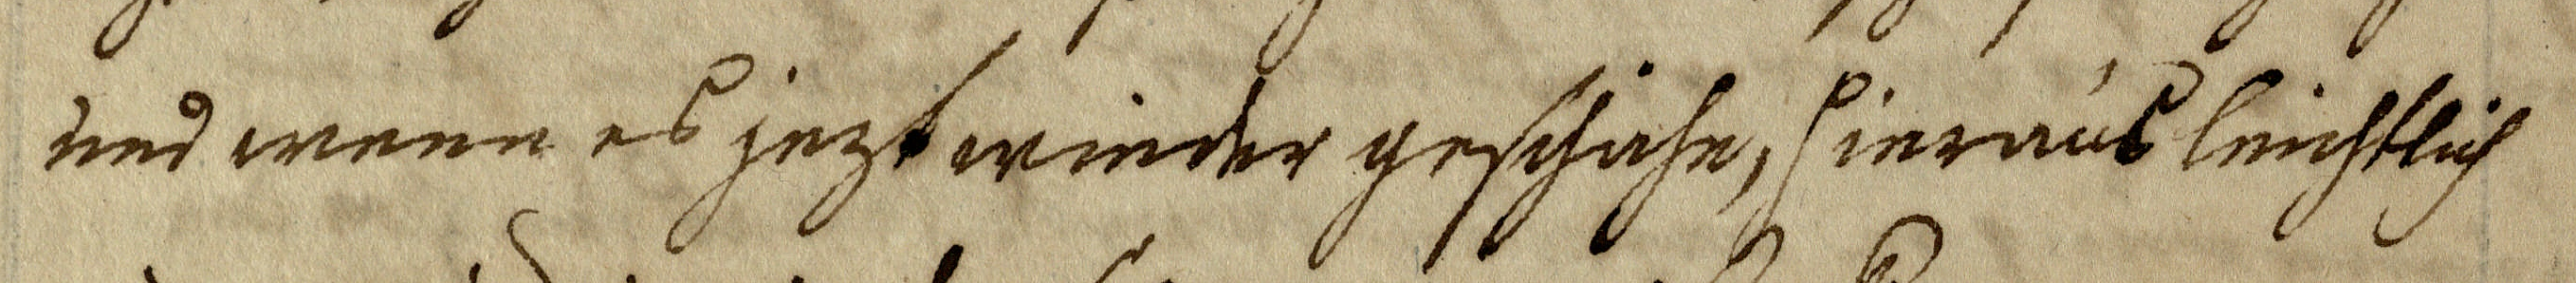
und wenn es jezt wieder geschähe, hieraus leichtlich
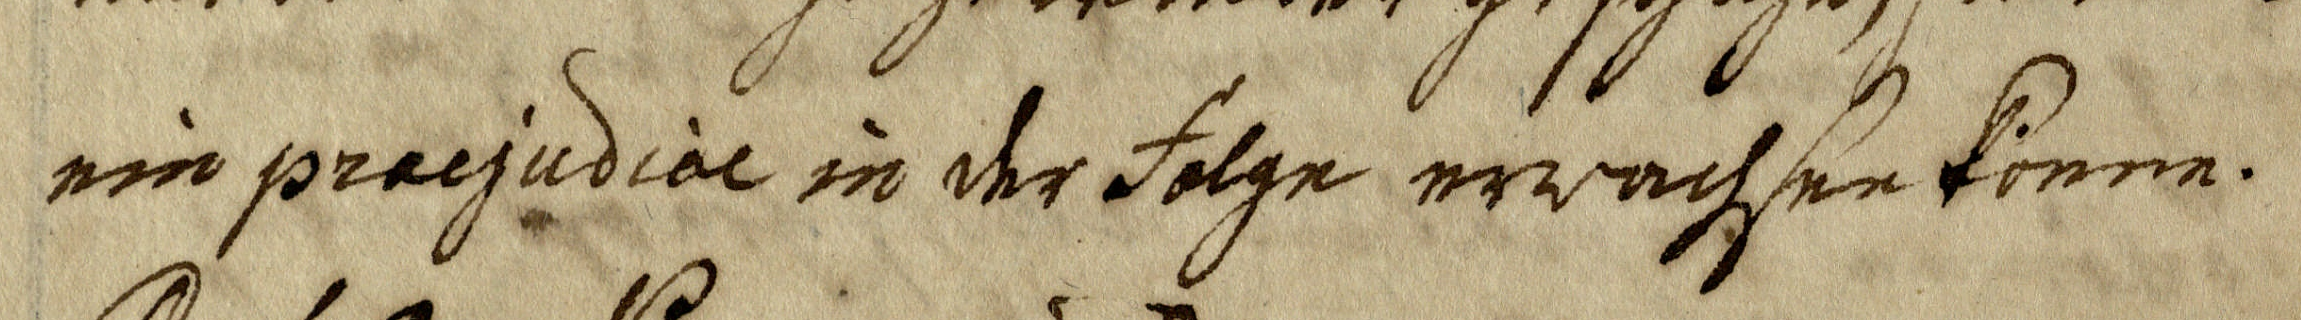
ein praejudice in der Folge erwachsen könne.
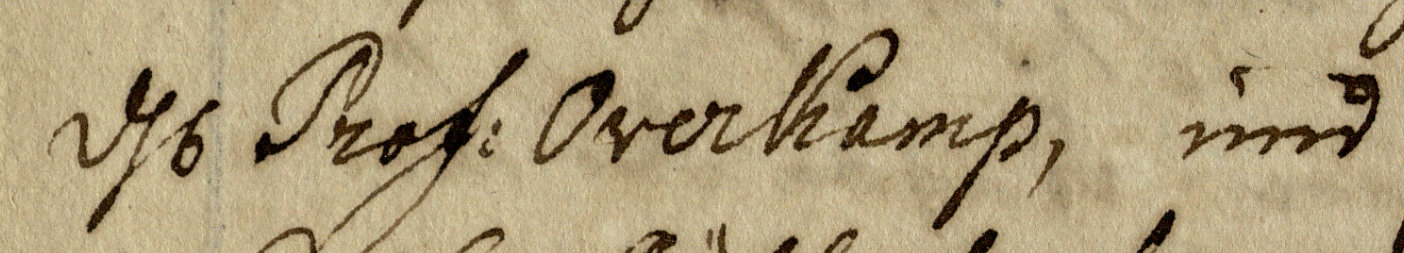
dh. Prof. Overkamp, und
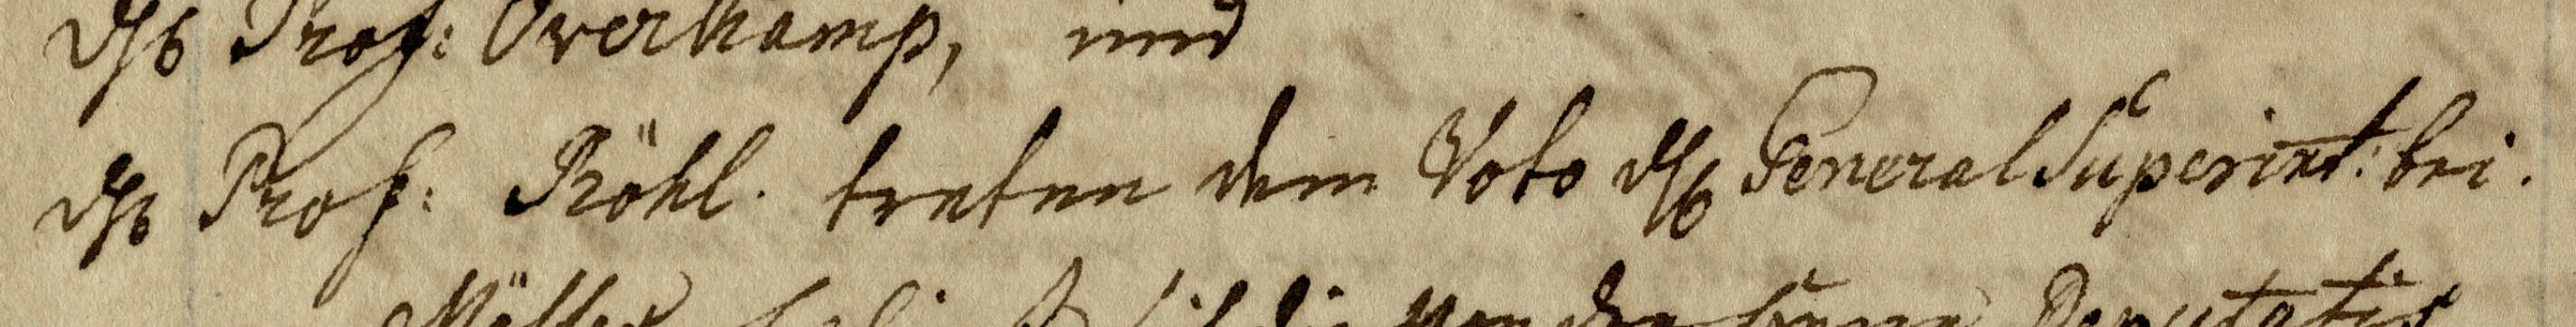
dh Prof. Röhl. treten dem Voto dh GeneralSuperint. bei.
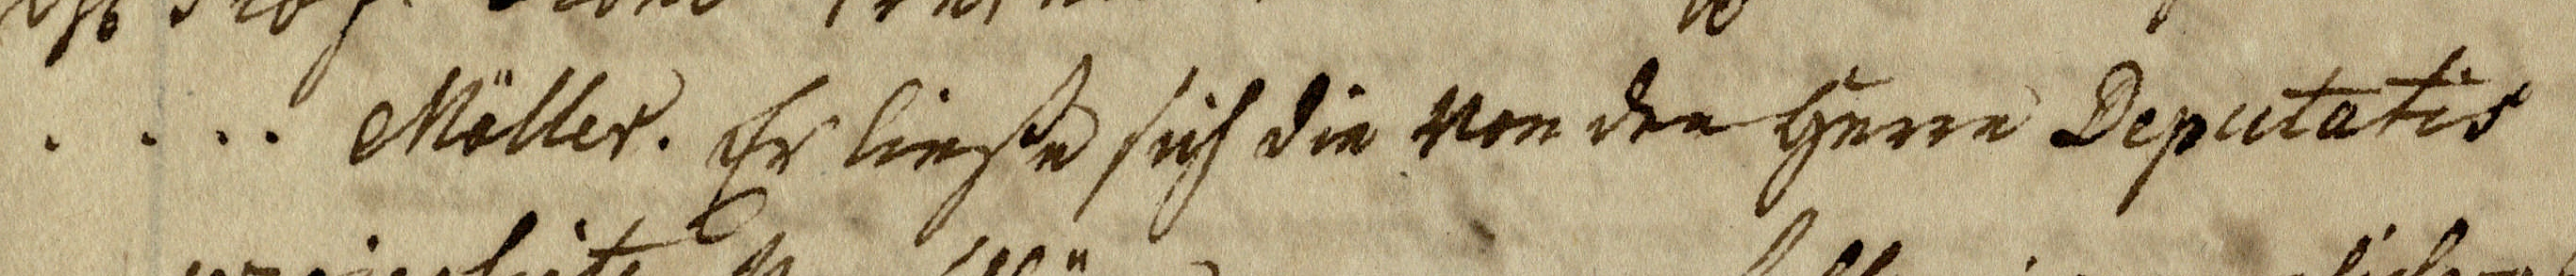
Möller. Er ließe sich die von den Herrn Deputatis
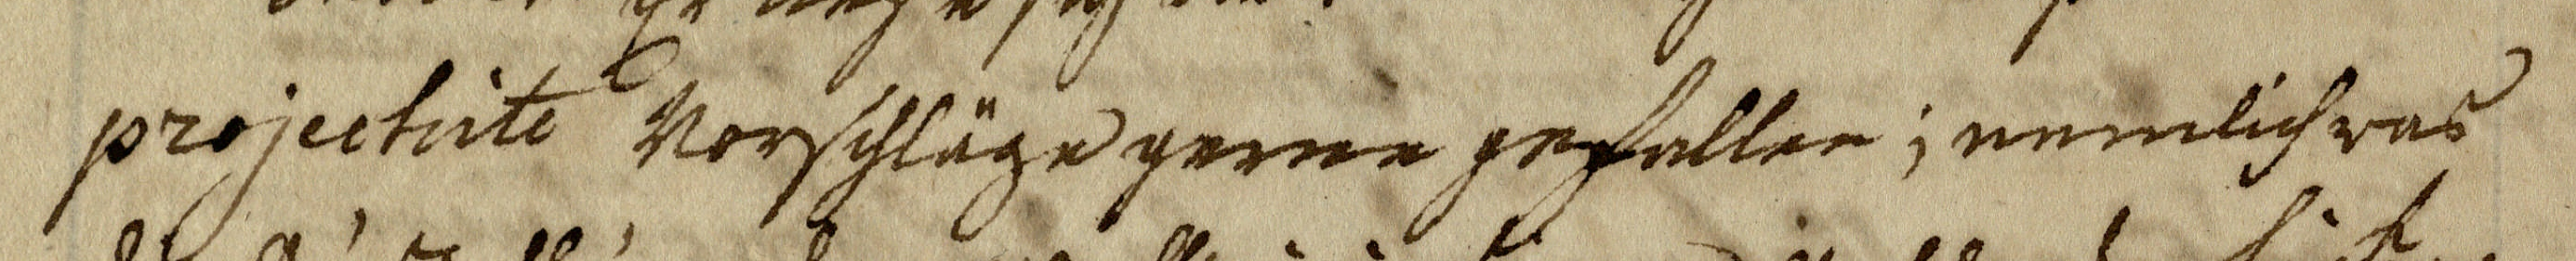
projectirte Vorschläge gerne gefallen, nemlich was
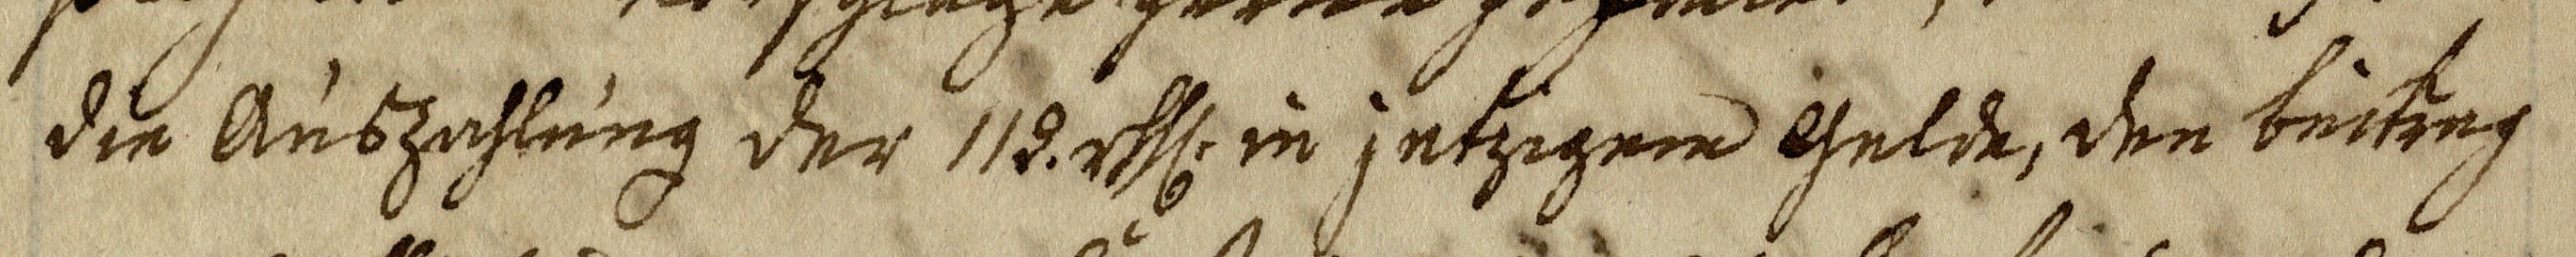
die Auszahlung der 112. rtl in jetzigem Gelde, den Beitrag
